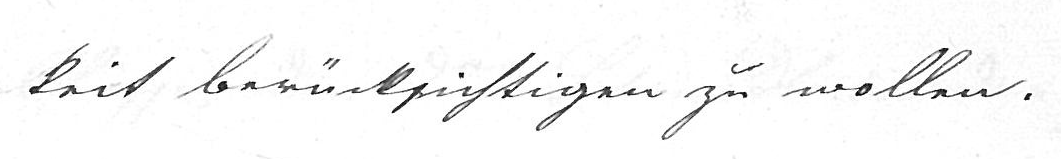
keit berücksichtigen zu wollen.
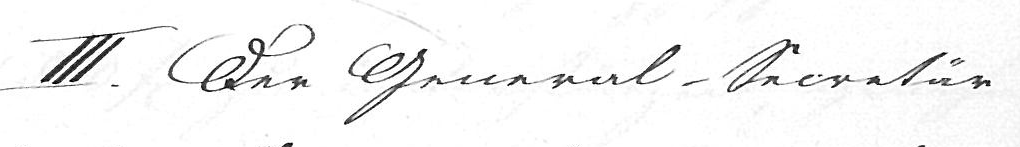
III. Der General-Secretär
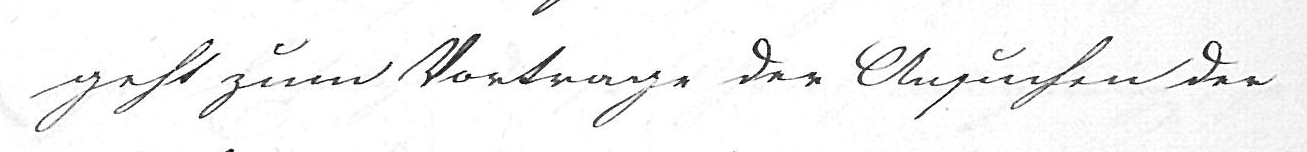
geht zum Vortrage der Ansuchen der
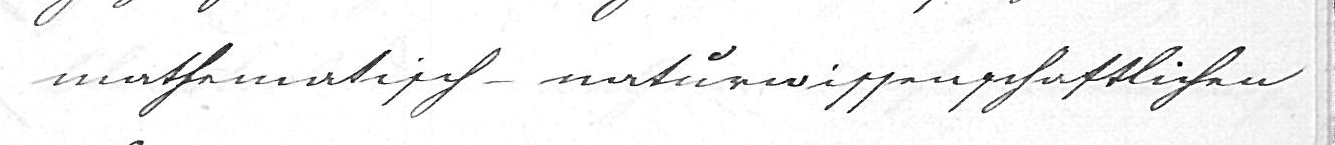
mathematisch-naturwissenschaftlichen
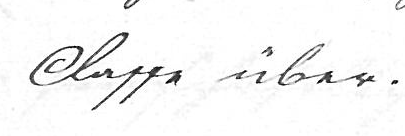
Classe über.
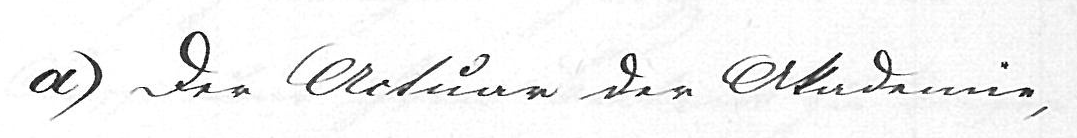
a) Der Actuar der Akademie,
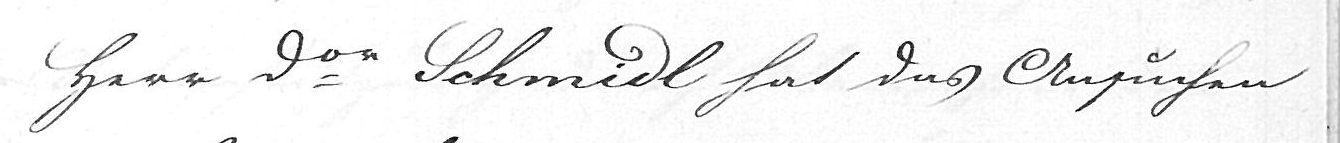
Herr Dor Schmidl hat das Ansuchen
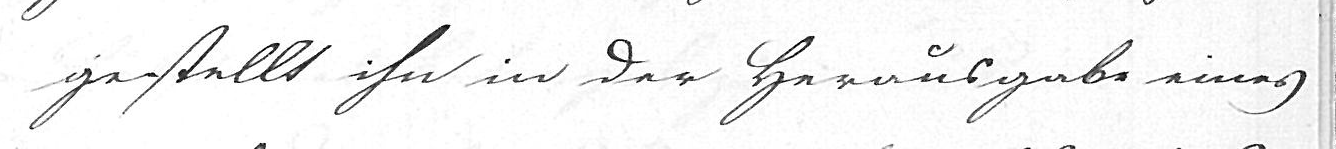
gestellt ihn in der Herausgabe eines
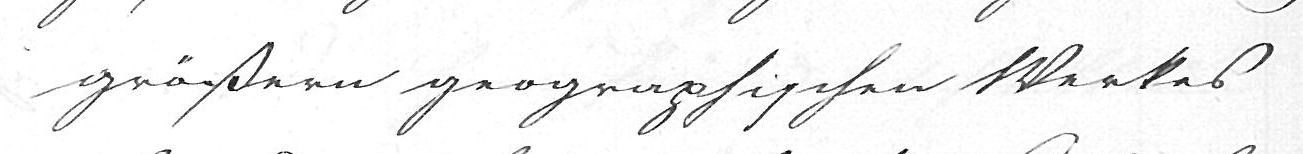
größern geographischen Werkes
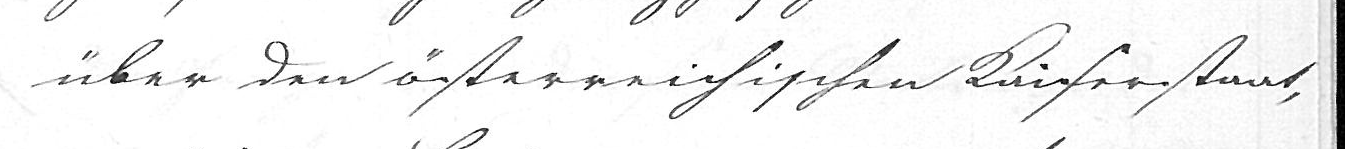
über den österreichischen Kaiserstaat,
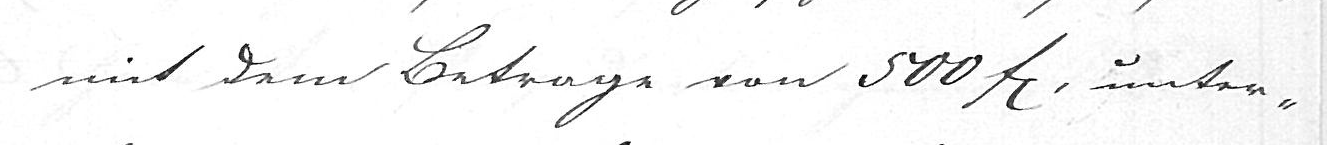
mit dem Betrage von 500 fl, unter-
